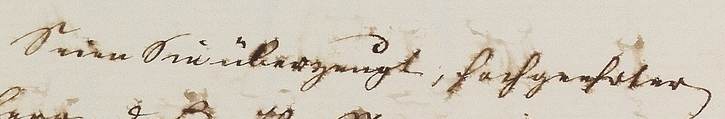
Seien Sie überzeugt, hochgeehrter
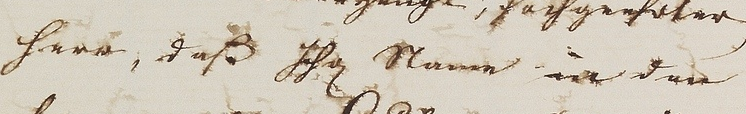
Herr, daß Ihr Name in den
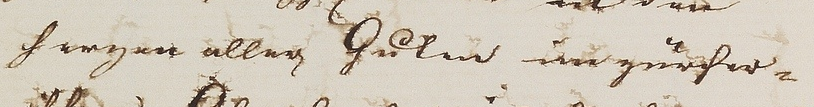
Herzen aller Guten im zürcher-
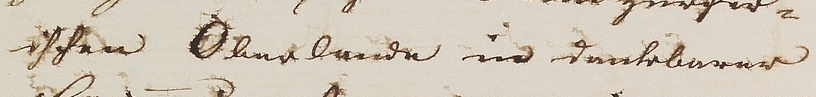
ischen Oberlande in dankbarer
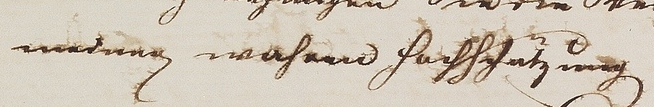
meiner wahren Hochschätzung.
